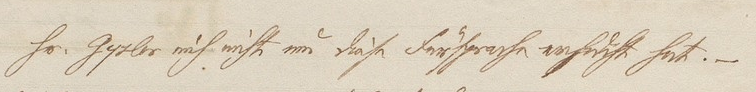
Hr. Gysler mich nicht um diese Fürsprache ersucht hat. –
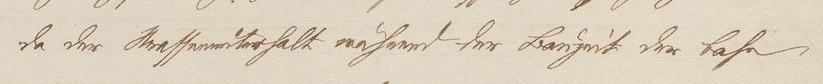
Da der Wasserunterhalt während der Bauzeit der Bahn
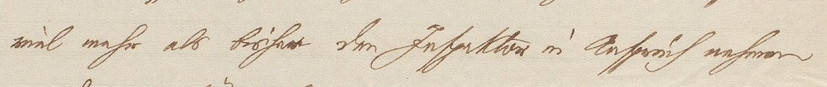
viel mehr als bisher den Inspektor in Anspruch nehmen
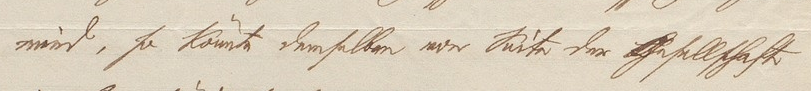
wird, so könnte demselben von Seite der Gesellschaft
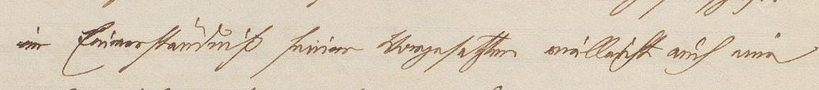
im Einverständniß seiner Vorgesetzten vielleicht auch eine
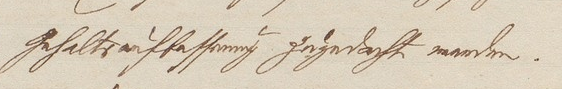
Gehaltsaufbesserung zugesandt werden.
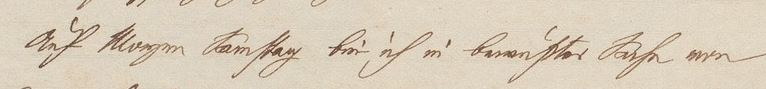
Auf Morgen Samstag bin ich in bewußter Sache von
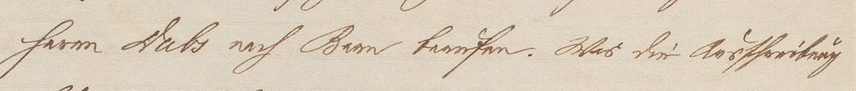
Herrn Dubs nach Bern berufen. Was die Ausschreibung
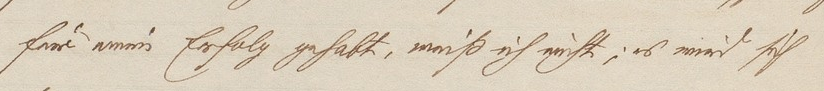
für einen Erfolg gehabt, weiß ich nicht; es wird sich
